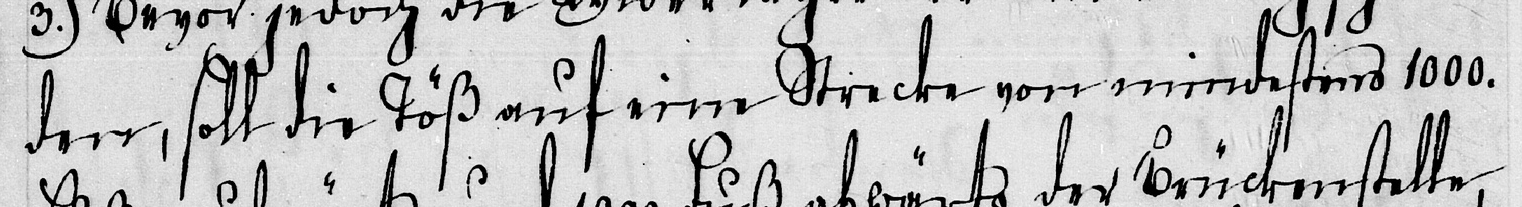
den, soll die Töß auf eine Strecke von mindestens 1000.
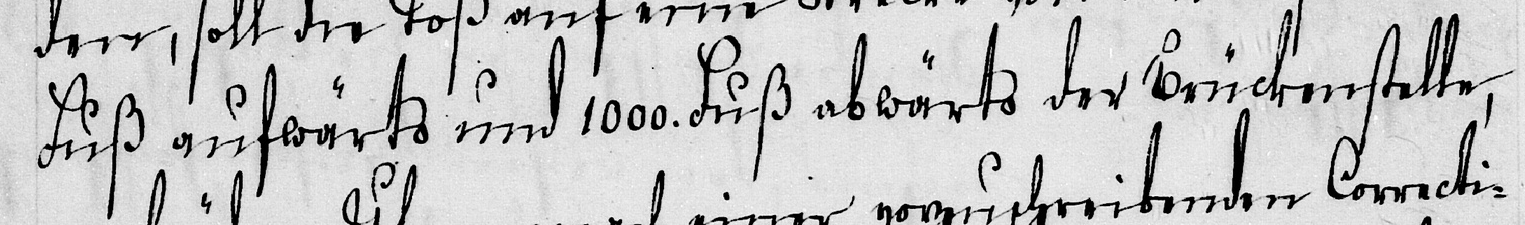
Fuß aufwärts und 1000. Fuß abwärts der Brückenstelle,
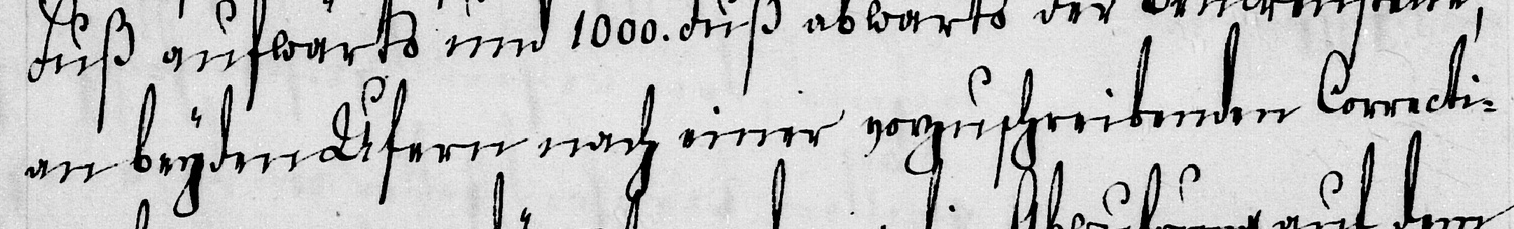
an beyden Ufern nach einer vorzuschreibenden Correcti¬
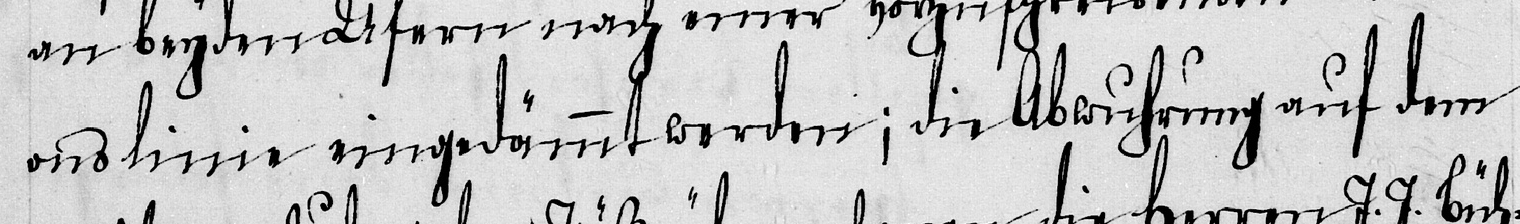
onslinie eingedämmt werden; die Abwuhrung auf dem
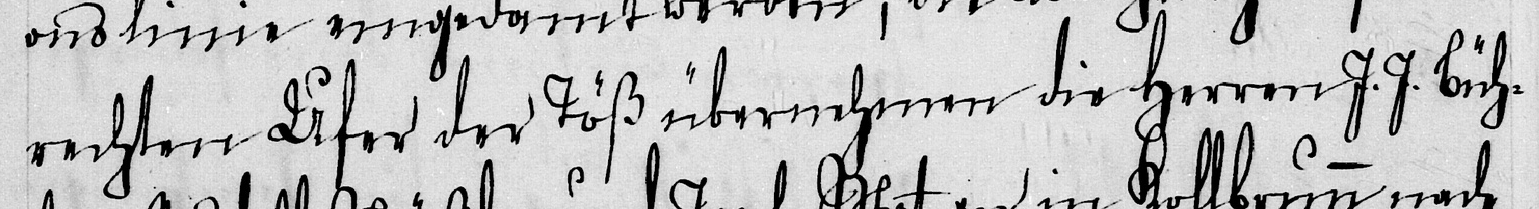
rechten Ufer der Töß übernehmen die Herren J. J. Büc¬
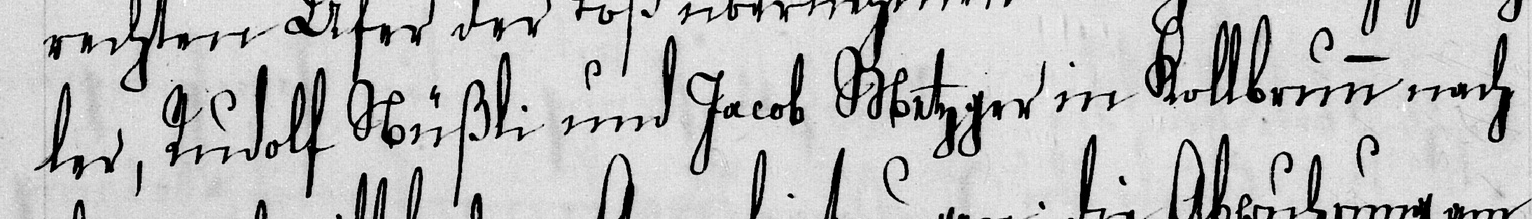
hler, Rudolf Nüßli und Jacob Metzger in Kollbrunn nach
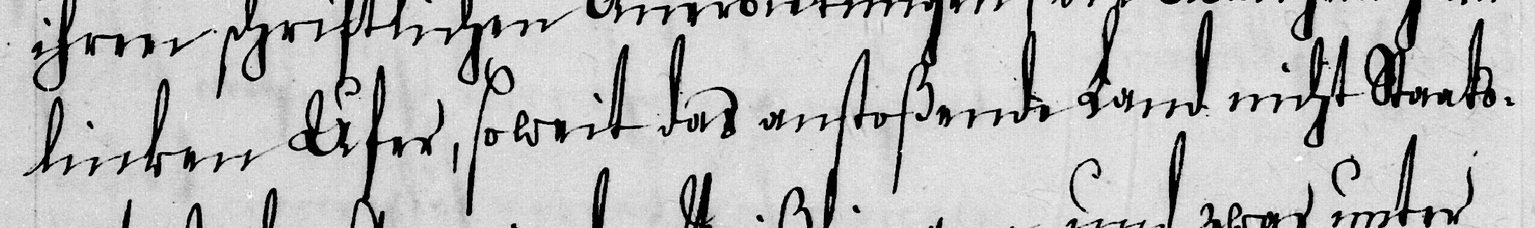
linken Ufer, soweit das anstoßende Land nicht Staat¬
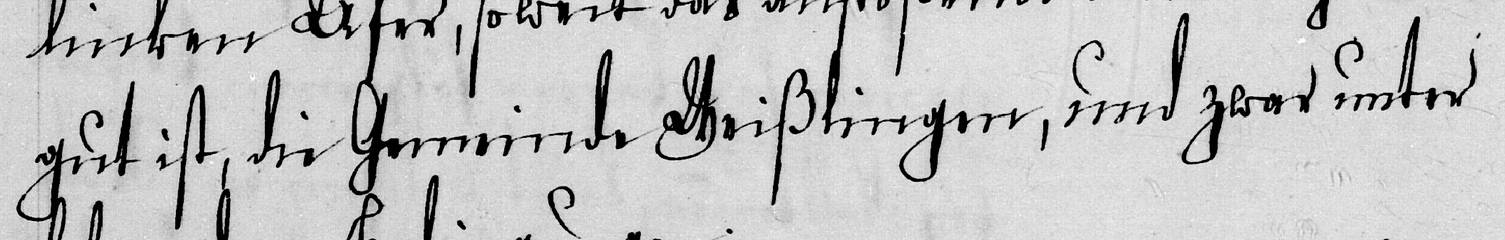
sgut ist, die Gemeinde Weißlingen, und zwar unter
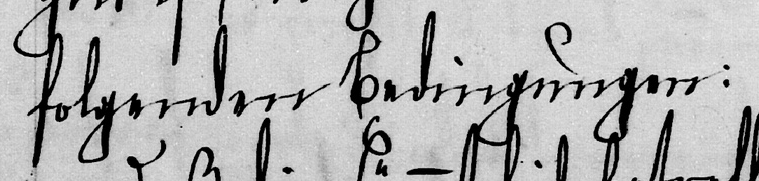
folgenden Bedingungen:
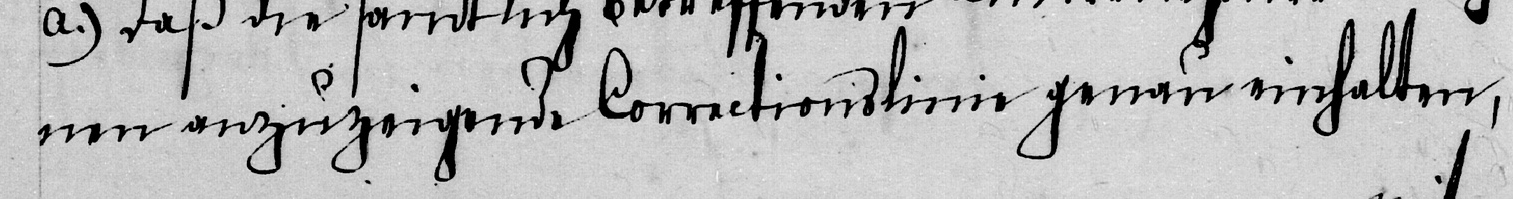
nen anzuzeigende Correctionslinie genau einhalten,
